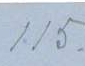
Herrn
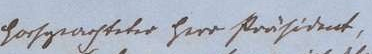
Hochgeachteter Herr Präsident,
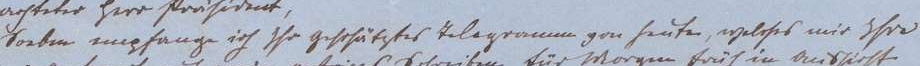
Soeben empfange ich Ihr geschätztes Telegramm von heute, welches mir Ihre
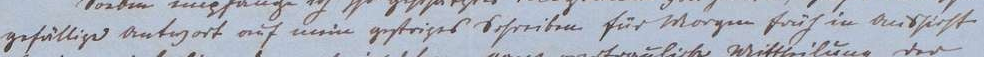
gefällige Antwort auf mein gestriges Schreiben für Morgen früh in Aussicht
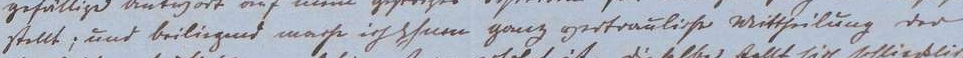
stellt; und beiliegend mache ich Ihnen ganz vertrauliche Mittheilung der
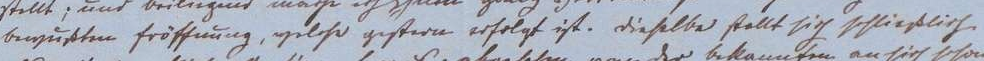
bewußten Eröffnung, welche gestern erfolgt ist. Dieselbe stellt sich schließlich
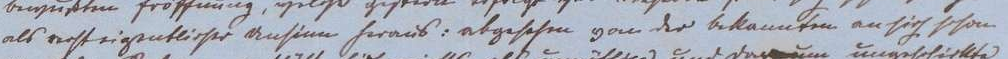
als recht eigentlicher Unsinn heraus: abgesehen von der bekannten an sich schon
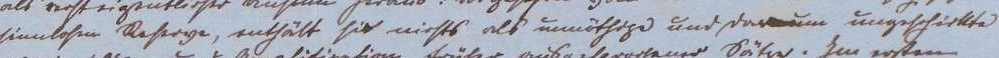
sinnlosen Reserve, enthält sie nichts als unnöthige und darum ungeschickte
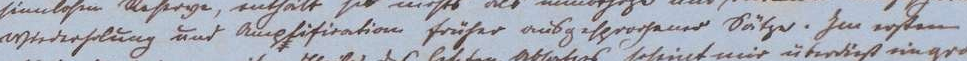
Wiederholung und Amplification früher ausgesprochener Sätze. Im ersten
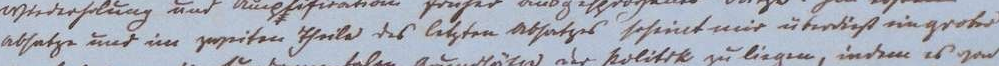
Absatze und im zweiten Theile des letzten Absatzes scheint mir überdieß ein grober
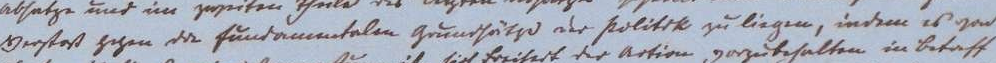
Verstoß gegen die fundamentalen Grundsätze der Politik zu liegen, indem es von
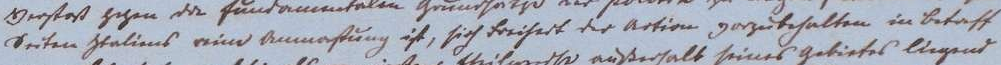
Seiten Italiens reine Anmaßung ist, sich Freiheit der Action vorzubehalten in Betreff
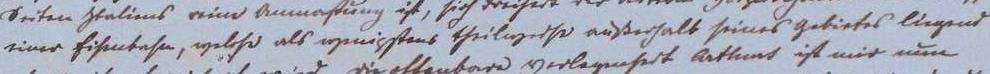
einer Eisenbahn, welche als wenigstens theilweise außerhalb seines Gebietes liegend
